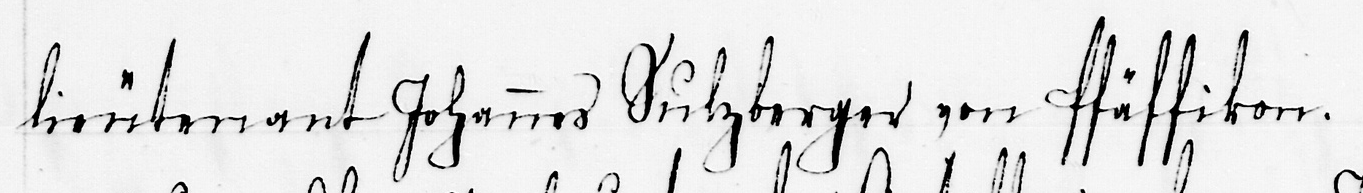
lieutenant Johannes Sulzberger von Pfäffikon.
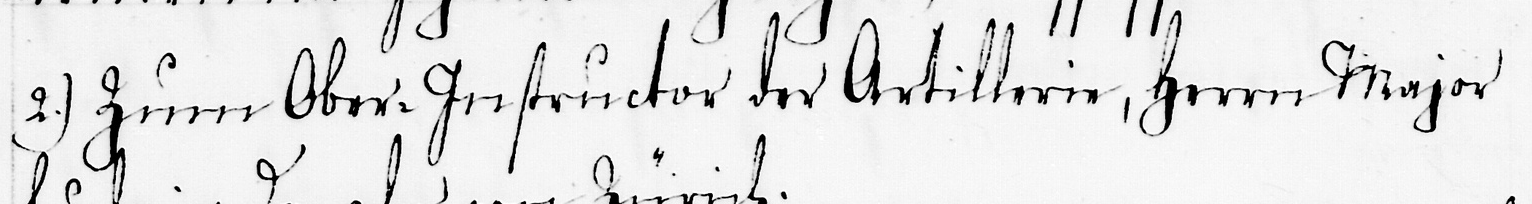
2.) Zum Ober-Instructor der Artillerie, Herrn Major
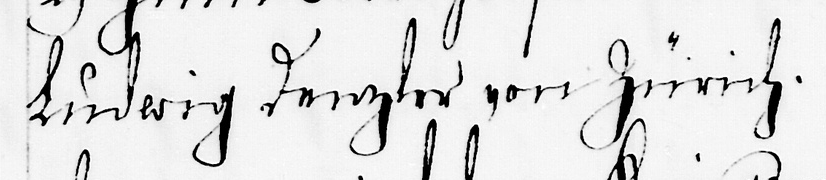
Ludwig Denzler von Zürich.
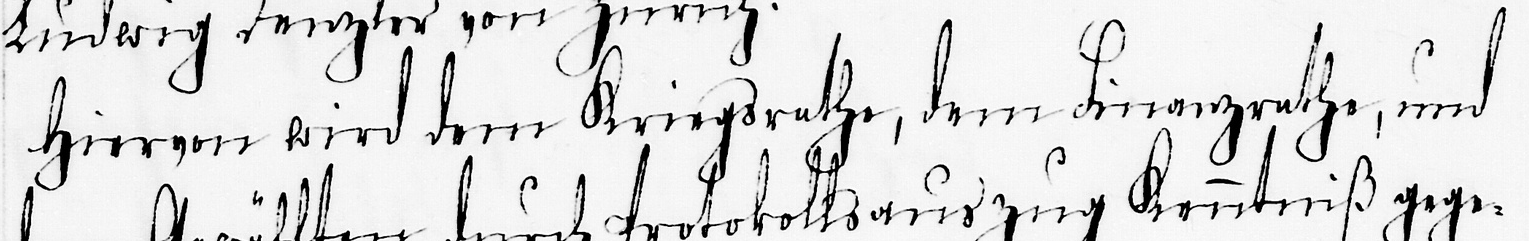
Hiervon wird dem Kriegsrathe, dem Finanzrathe, und
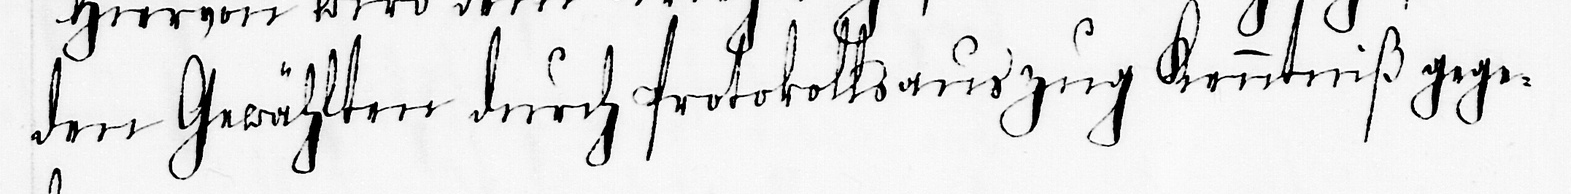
den Gewählten durch Protokollsauszug Kenntniß gege¬
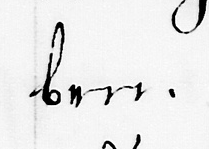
ben.
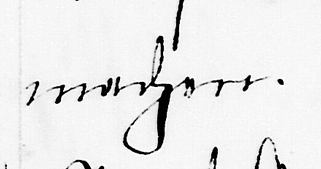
machen.
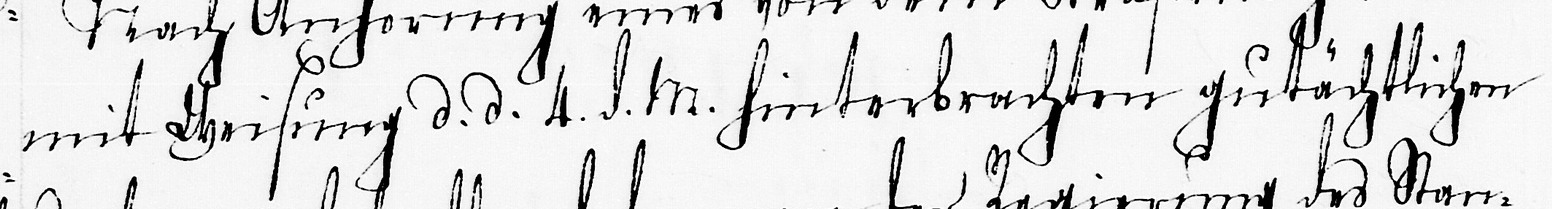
mit Weisung d. d. 4. d. M. hinterbrachten gutächtlichen
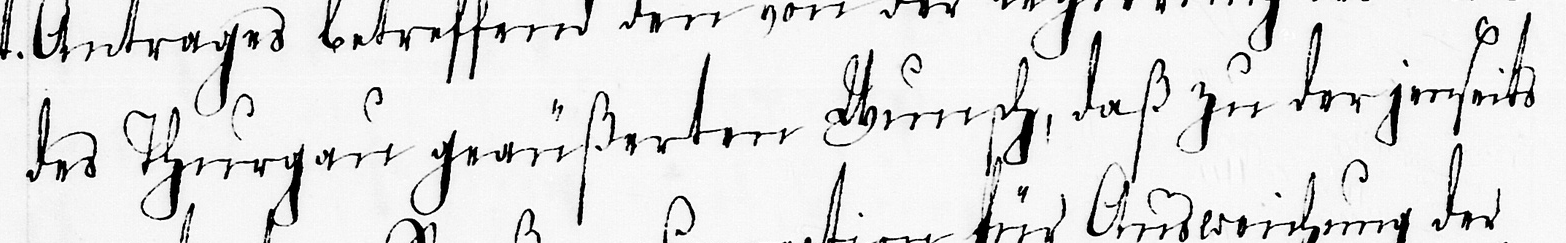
des Thurgau geäußerten Wunsch, daß zu der jenseits
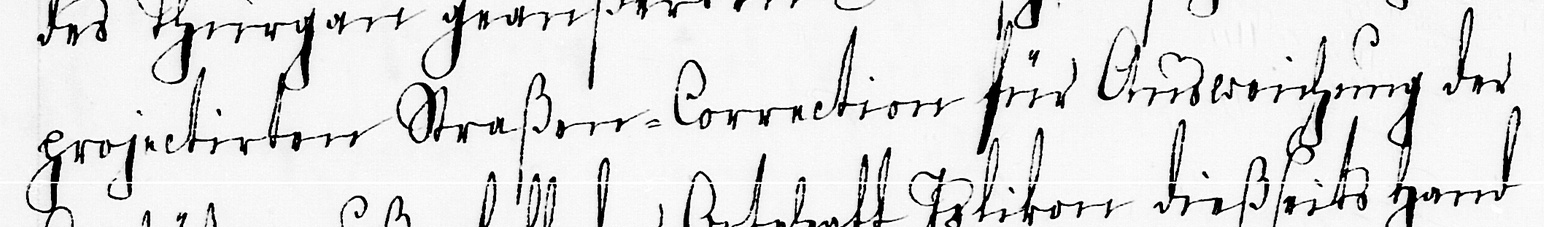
projectirten Straßen-Correction für Ausweichung der
